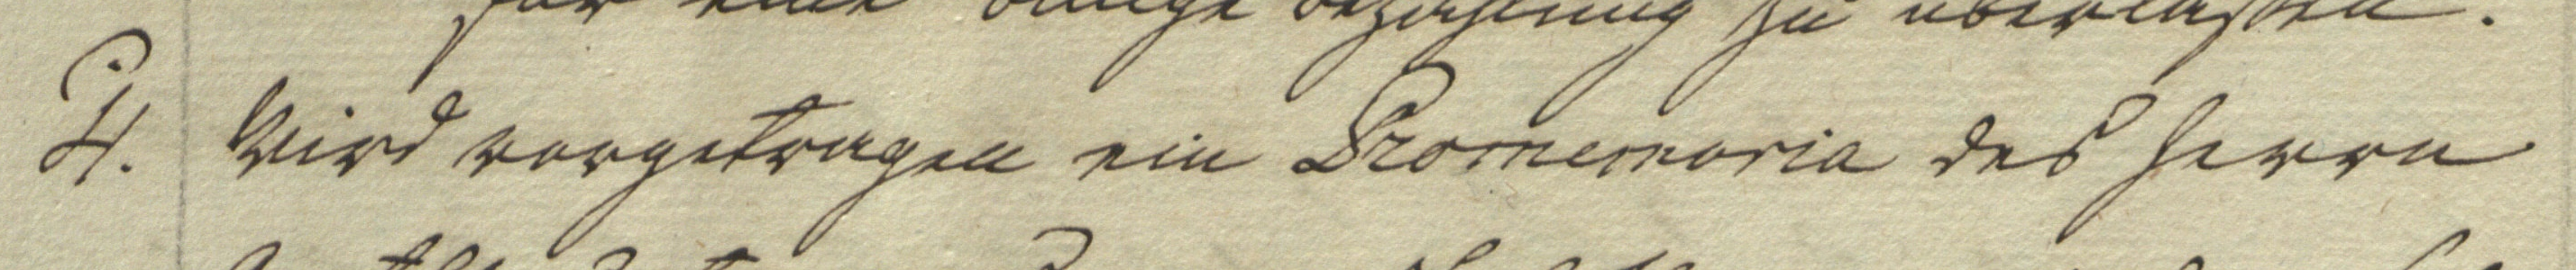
4. Wird vorgetragen ein Promemoria des Herrn
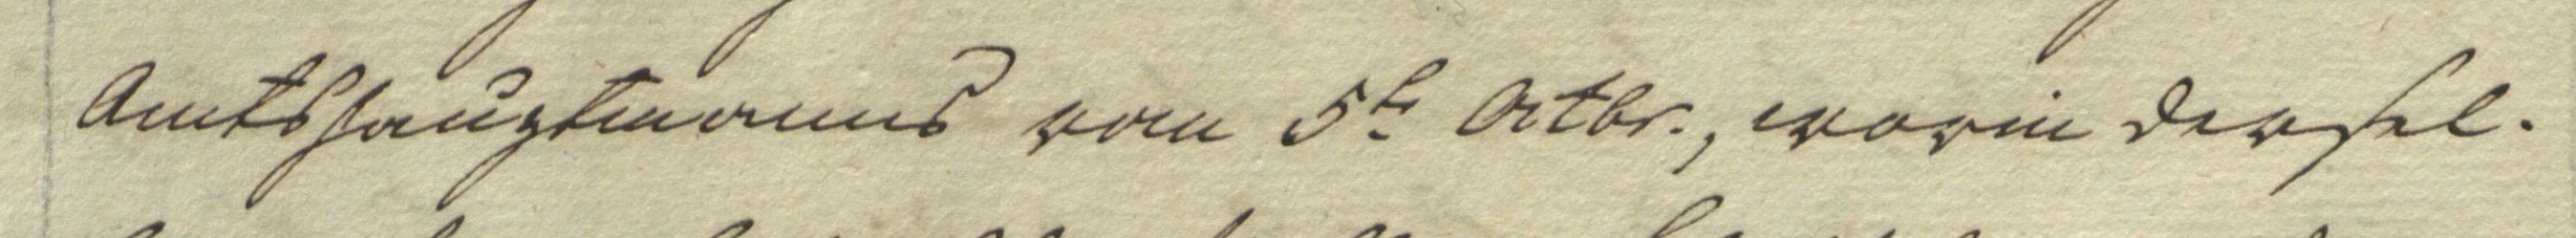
Amtshauptmanns vom 5 t Octbr., worin dersel¬
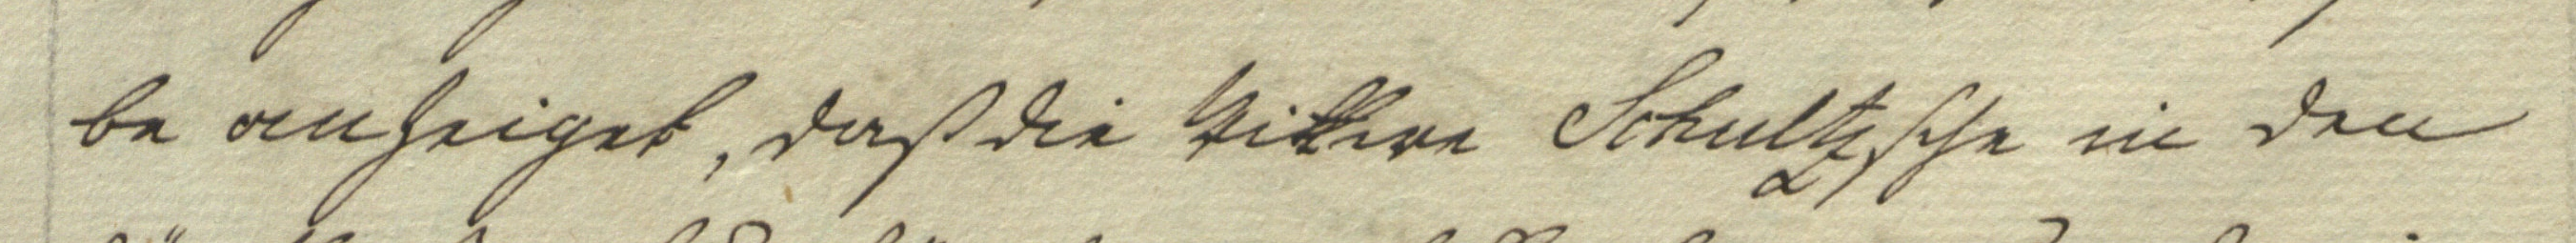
be anzeiget, daß die Wittwe Schultzsche in den
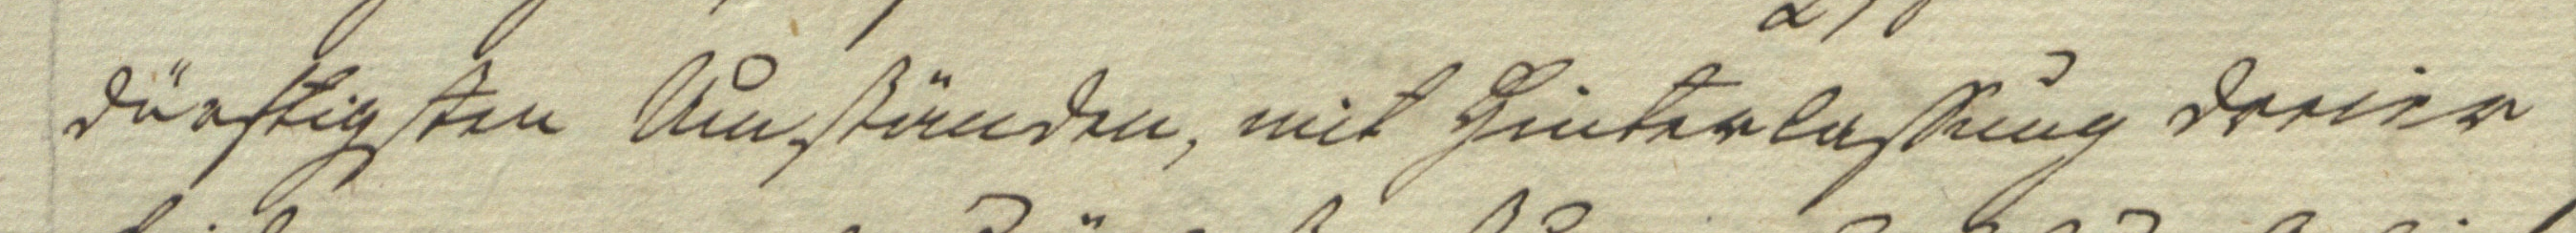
dürftigsten Umständen, mit Hinterlassung dreier
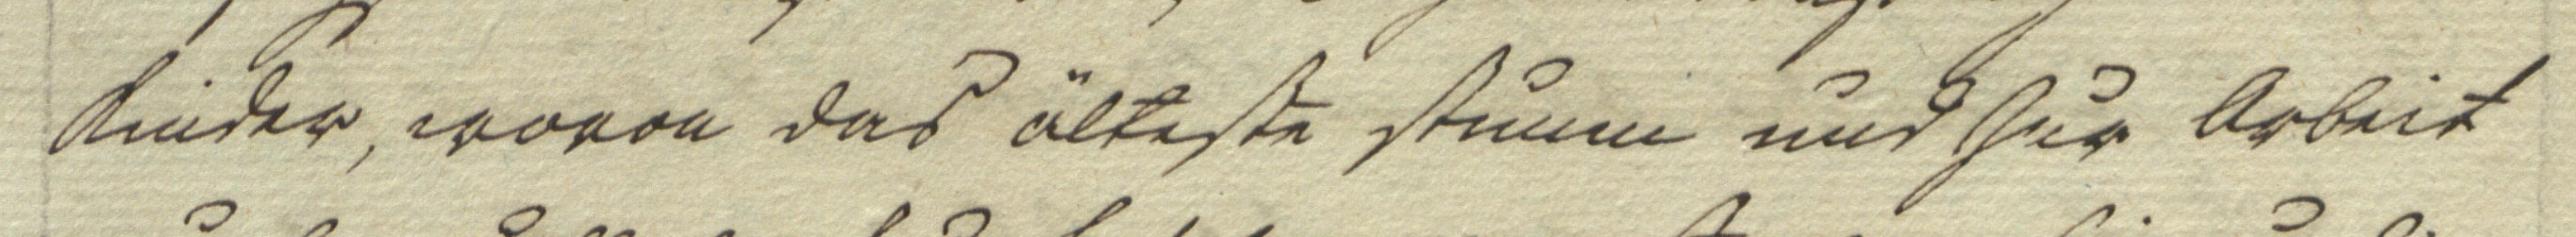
Kinder, wovon das älteste stumm und zur Arbeit
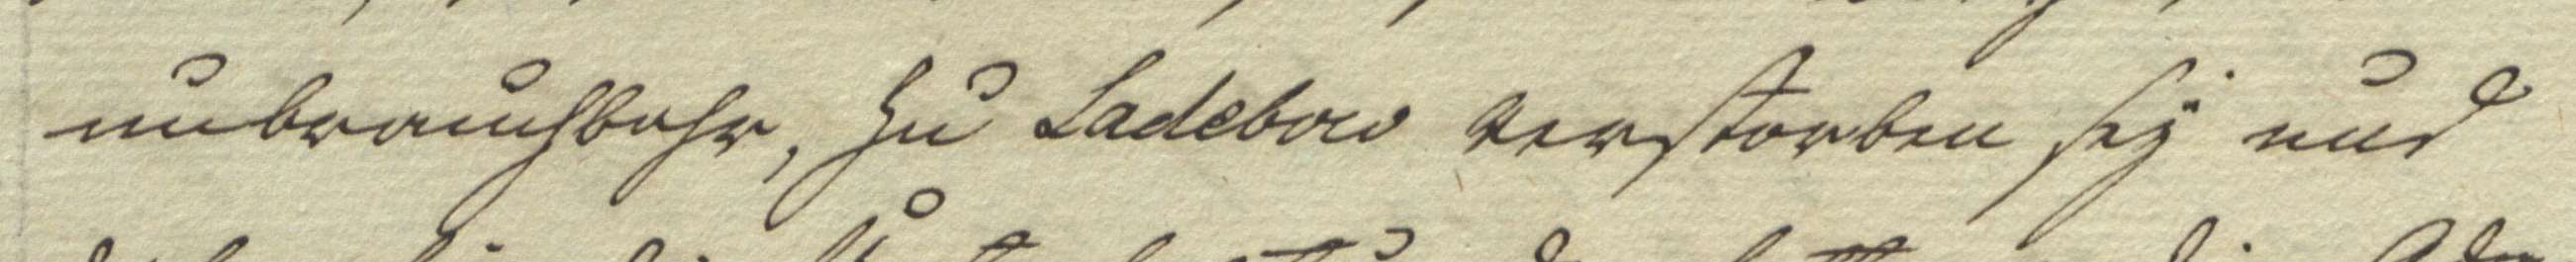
unbrauchbahr, zu Ladebow verstorben seÿ und
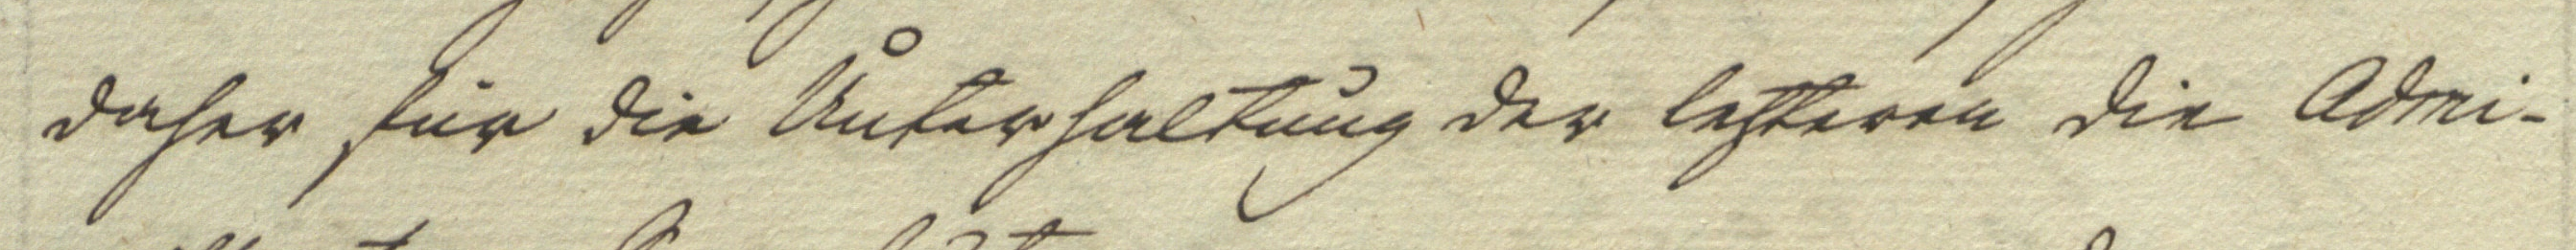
daher für die Unterhaltung der letzteren die Admi¬
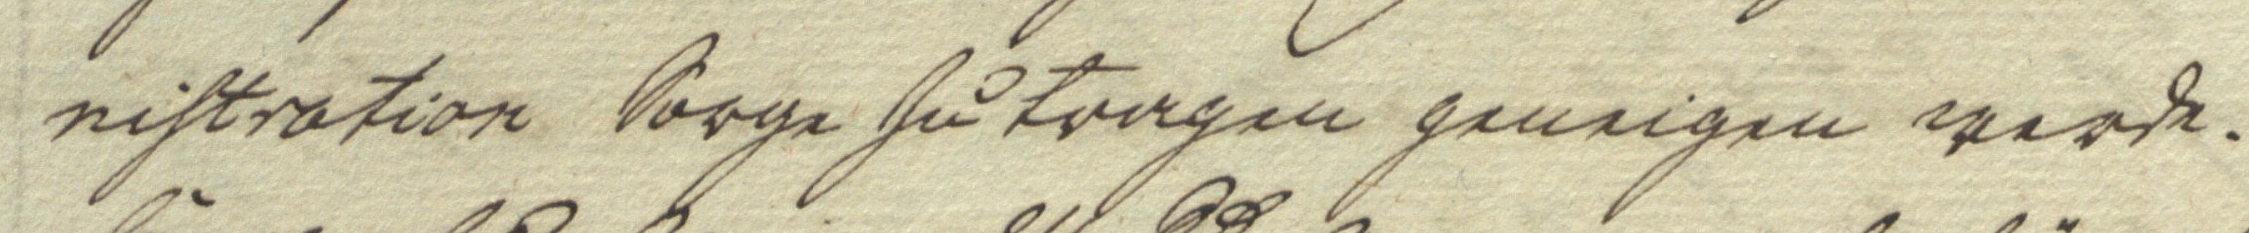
nistration Sorge zu tragen geneigen werde.
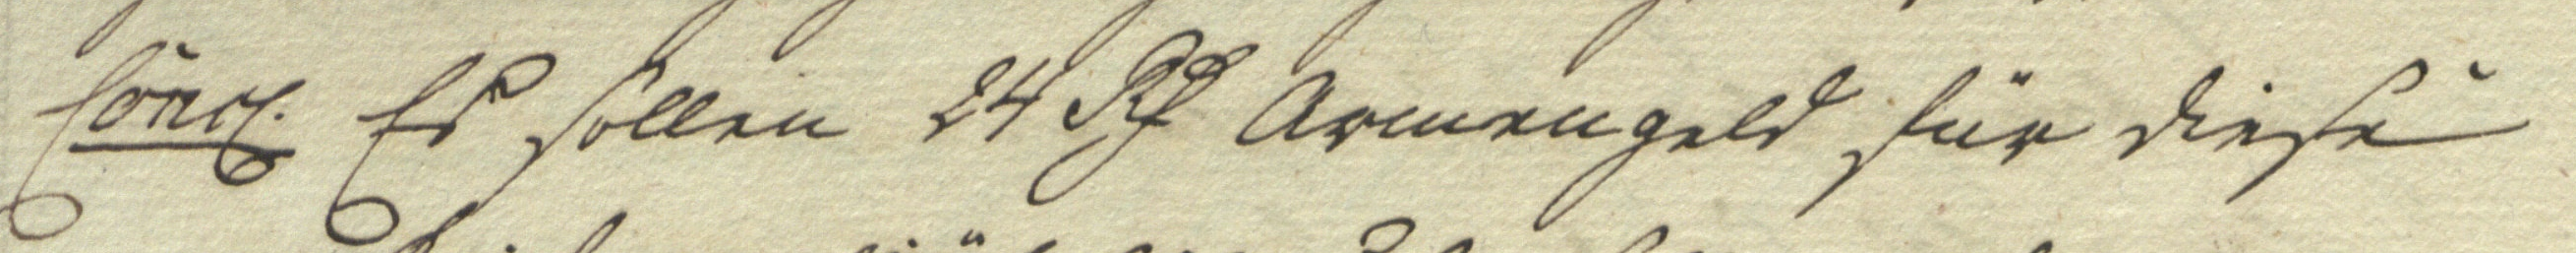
Concl. Es sollen 24 Rf Armengeld für diese
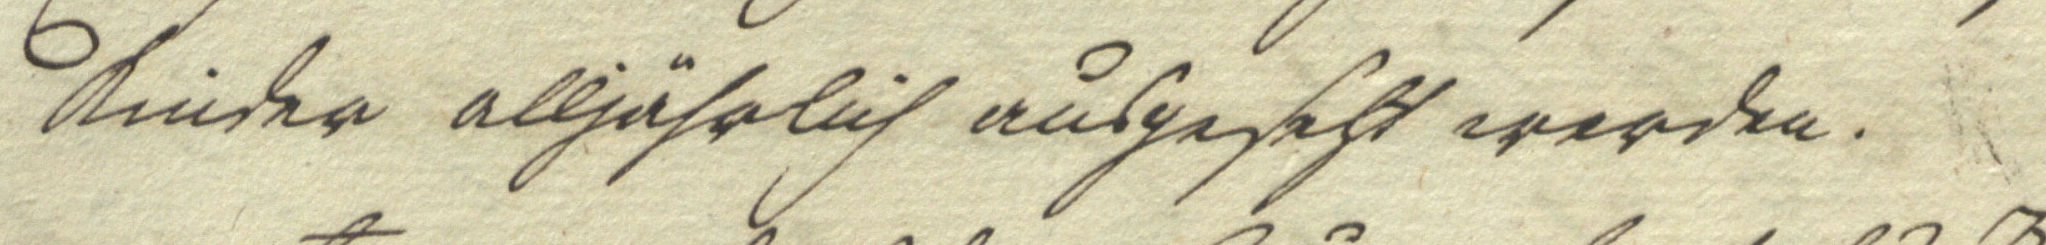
Kinder alljährlich ausgesetzt werden.
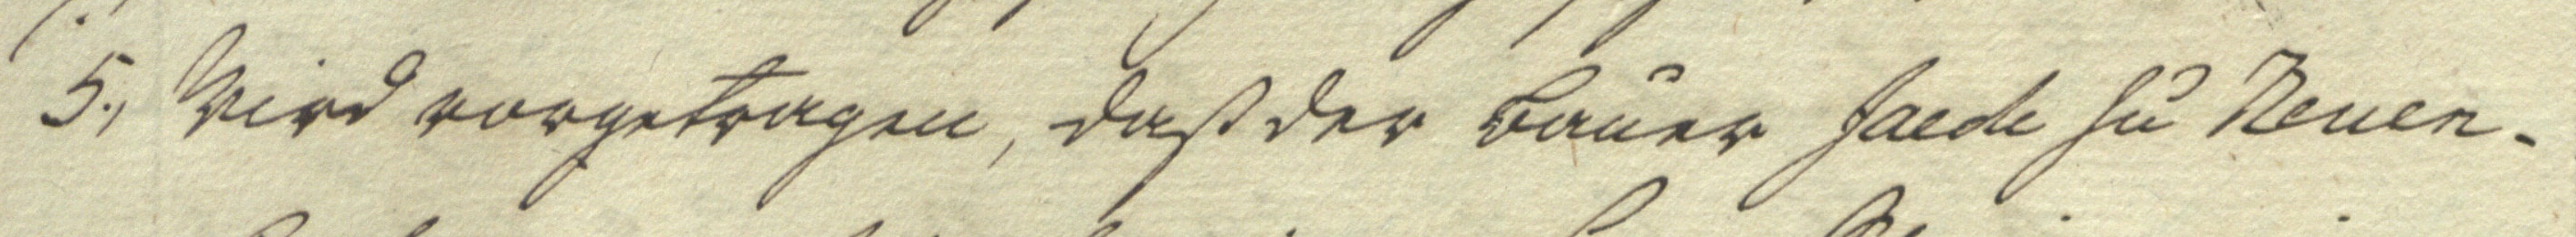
5., Wird vorgetragen, daß der Bauer Jaede zu Neuen¬
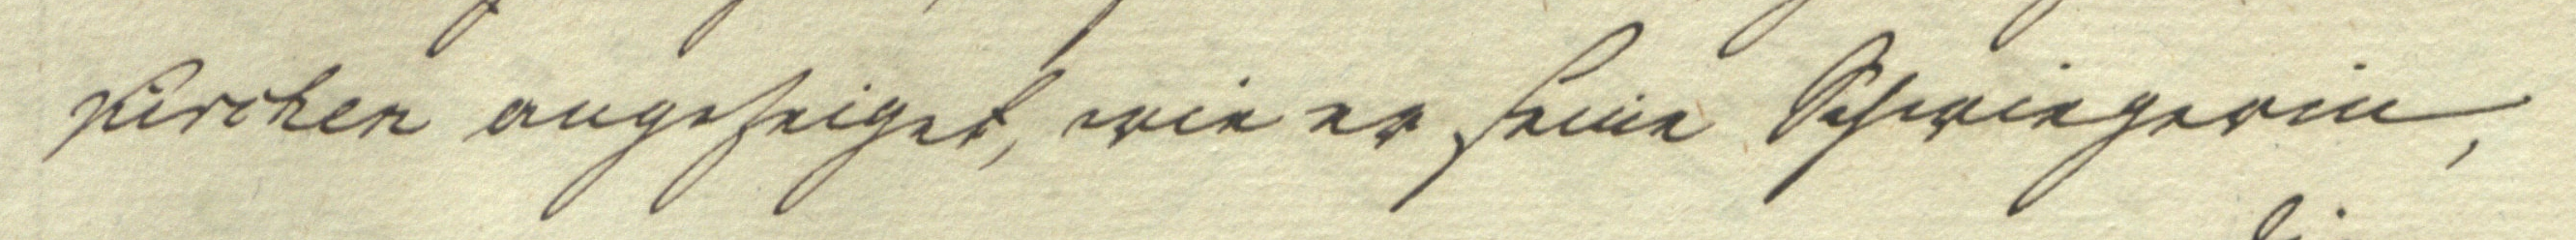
Kirchen angezeiget, wie er seine Schwiegerin,
